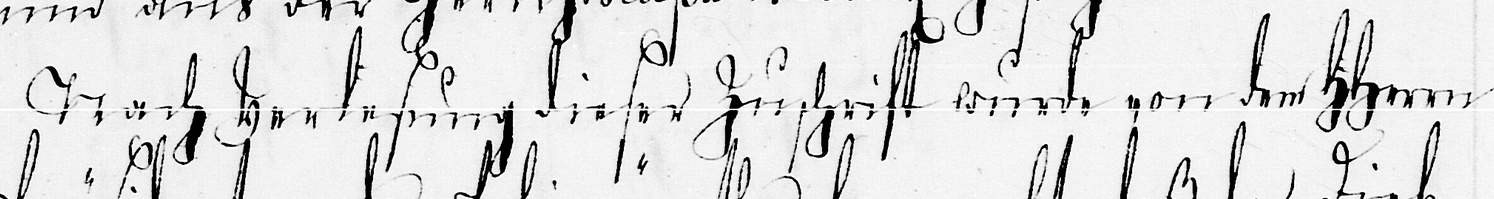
Nach Verlesung dieser Zuschrift wurde von dem HHerrn
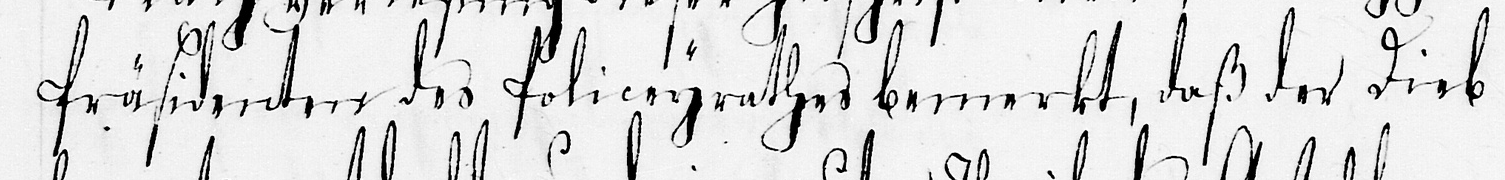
Präsidenten des Policeyrathes bemerkt, daß der Dieb
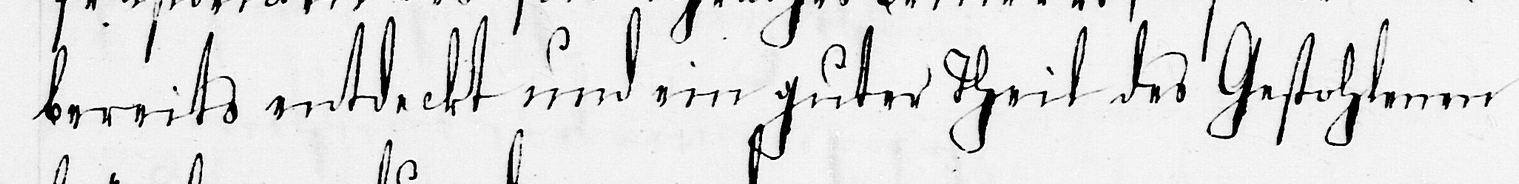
bereits entdeckt und ein guter Theil des Gestohlenen
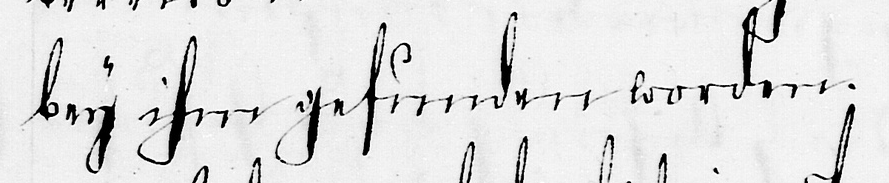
bey ihm gefunden worden.
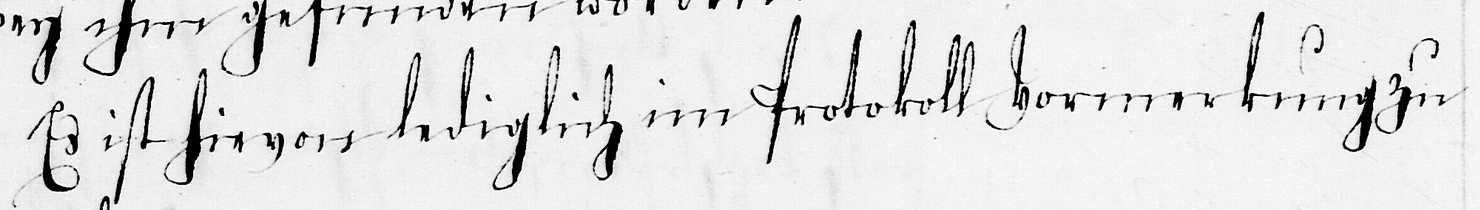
Es ist hievon lediglich im Protokoll Vormerkung zu
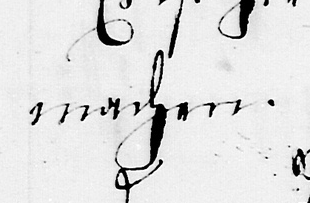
machen.
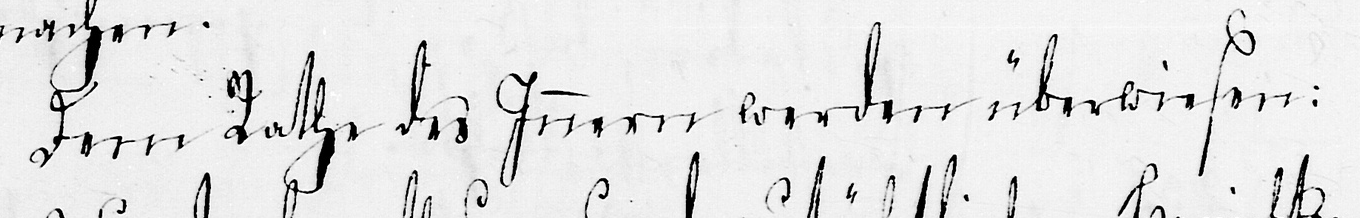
Dem Rathe des Innern werden überwiesen:
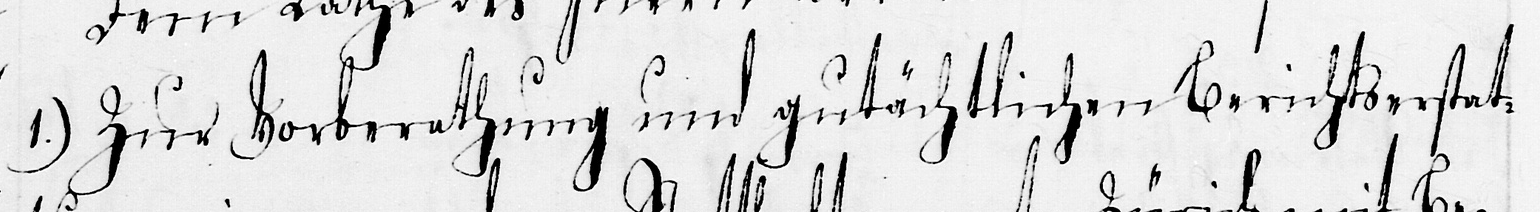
1.) Zur Vorberathung und gutächtlichen Berichtserstat¬
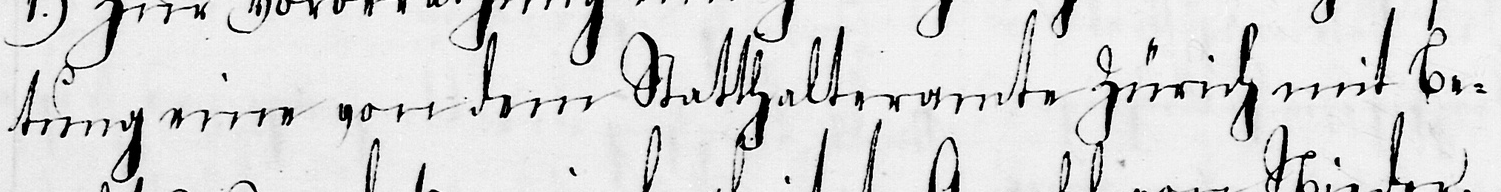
tung eine von dem Statthalteramte Zürich mit Be¬
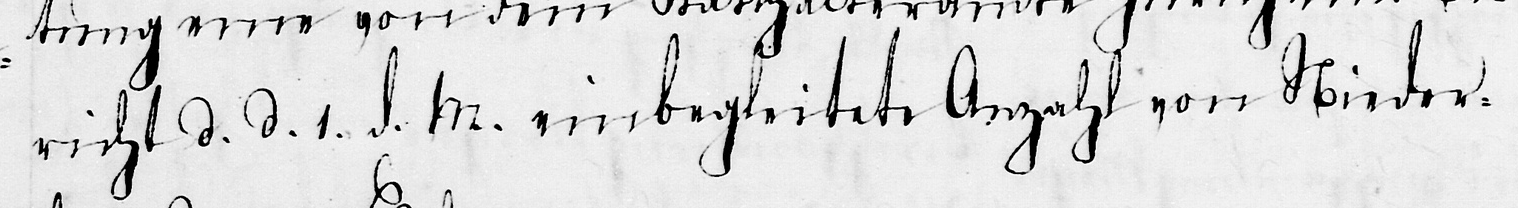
richt d. d. 1. d. M. einbegleitete Anzahl von Nieder¬
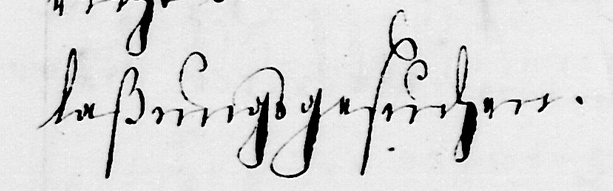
laßungsgesuchen.
